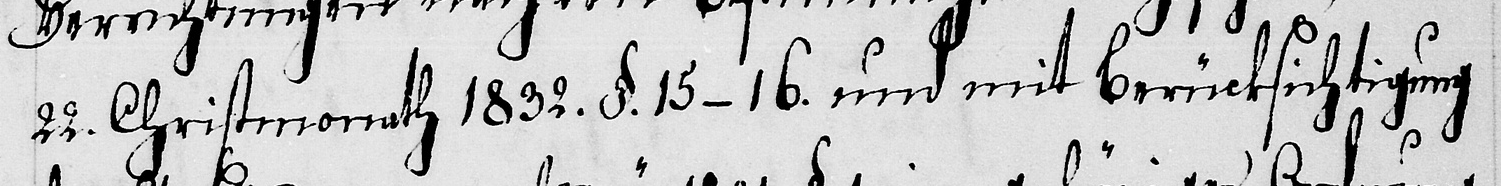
22. Christmonath 1832. §. 15–16. und mit Berücksichtigung
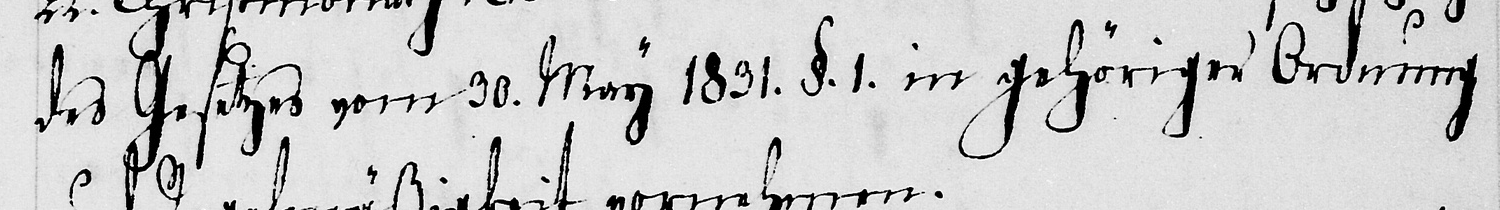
des Gesetzes vom 30. May 1831. §. 1. in gehöriger Ordnung
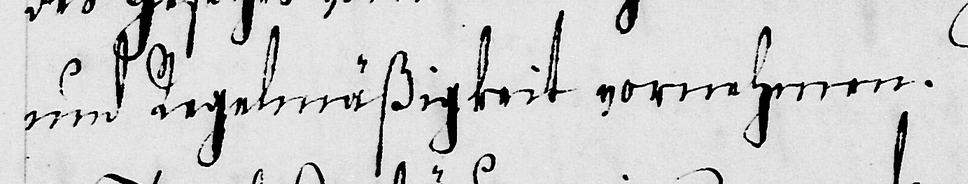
und Regelmäßigkeit vornehmen.
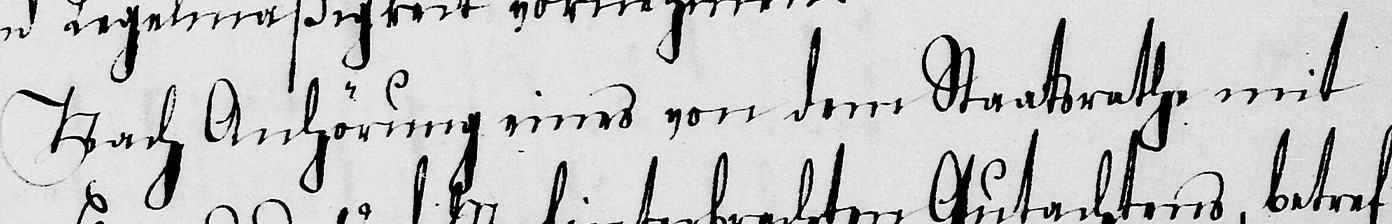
Nach Anhörung eines von dem Staatsrathe mit
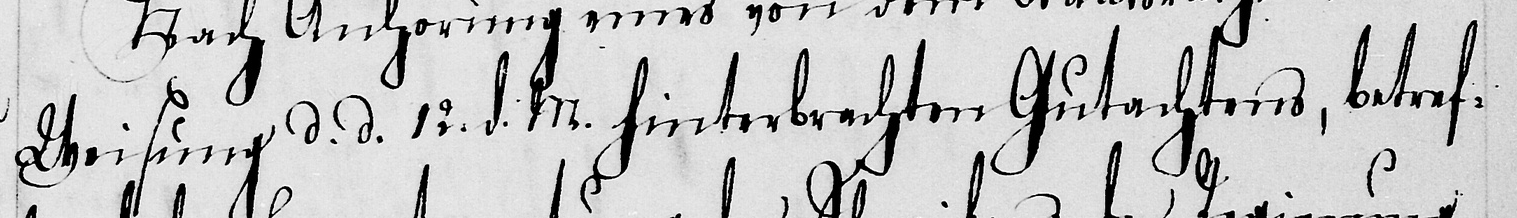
Weisung d.d. 12. d. M. hinterbrachten Gutachtens, betref¬
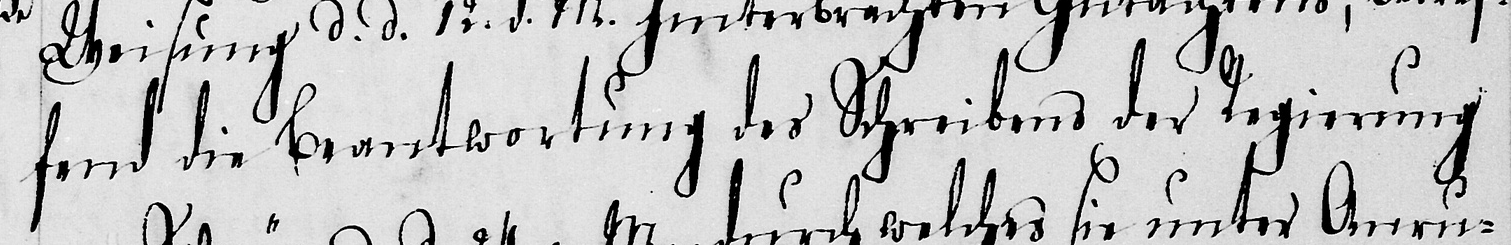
fend die Beantwortung des Schreibens der Regierung
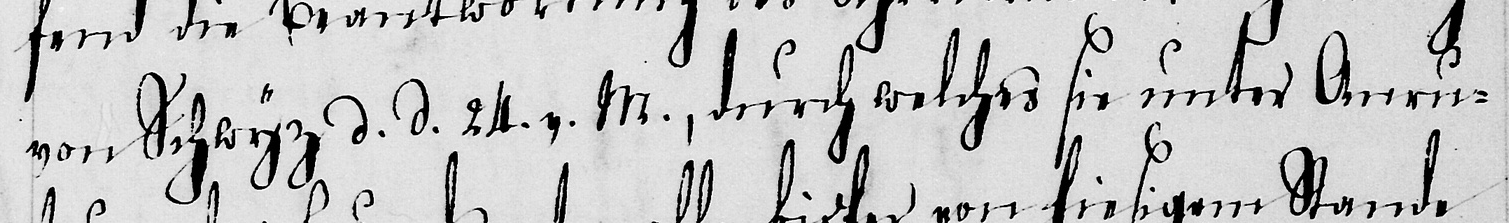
von Schwyz d.d. 24. v. M., durch welches sie unter Anru¬
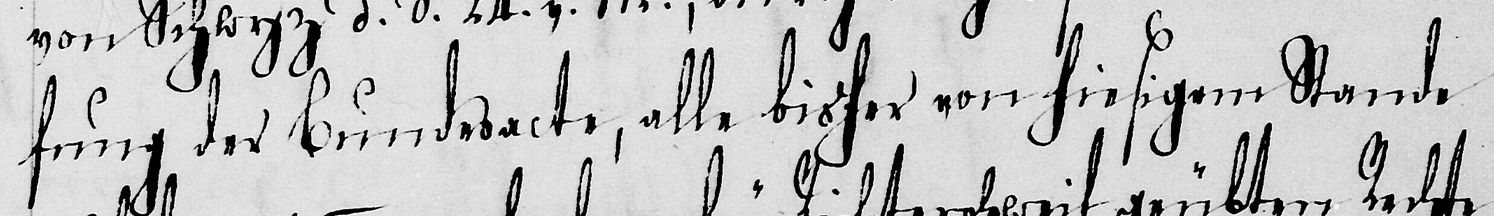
fung der Bundesacte, alle bisher von hiesigem Stande
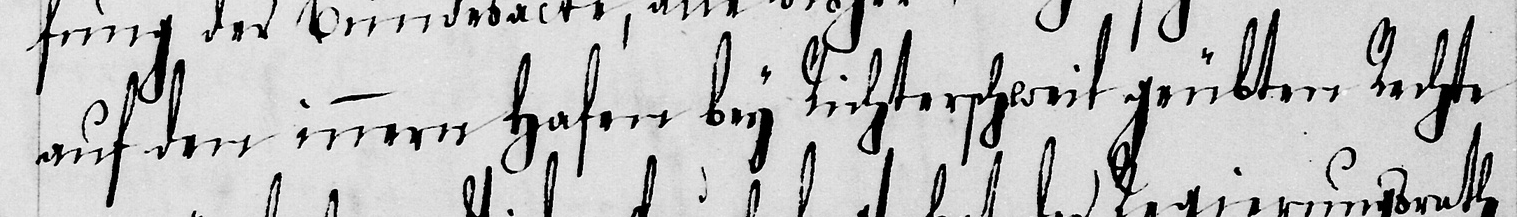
auf den innern Hafen bey Richterschweil geübten Rechte
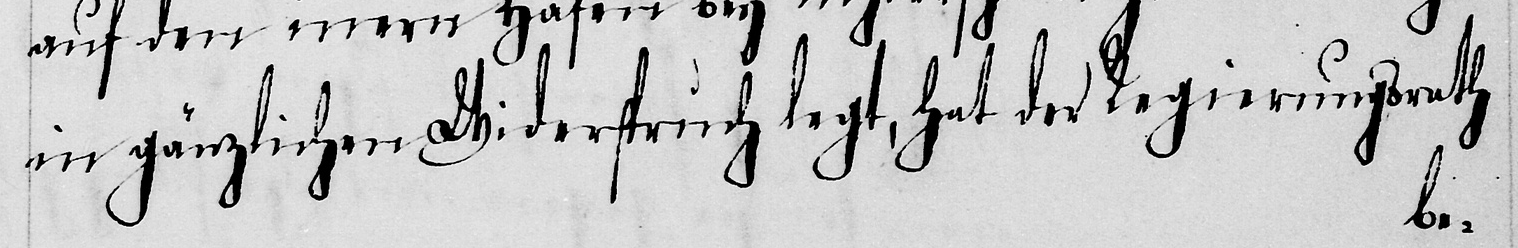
in gänzlichen Widerspruch legt, hat der Regierungsrath
